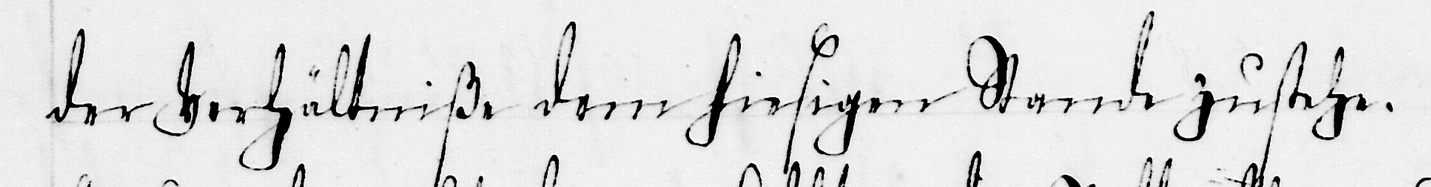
der Verhältniße dem hiesigen Stande zustehe.
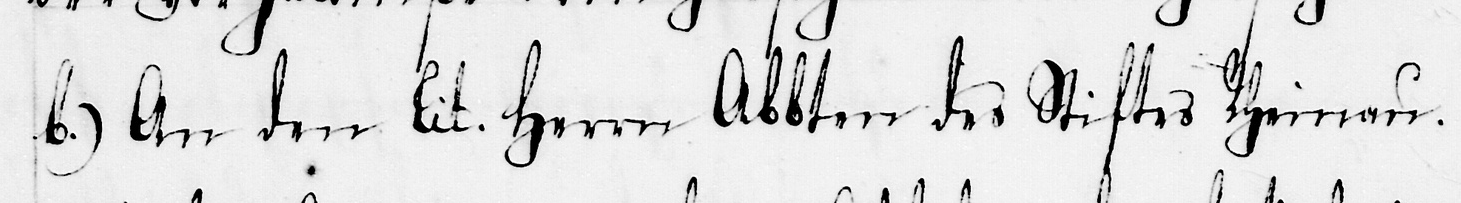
b.) An den Tit. Herrn Abbten des Stiftes Rheinau.
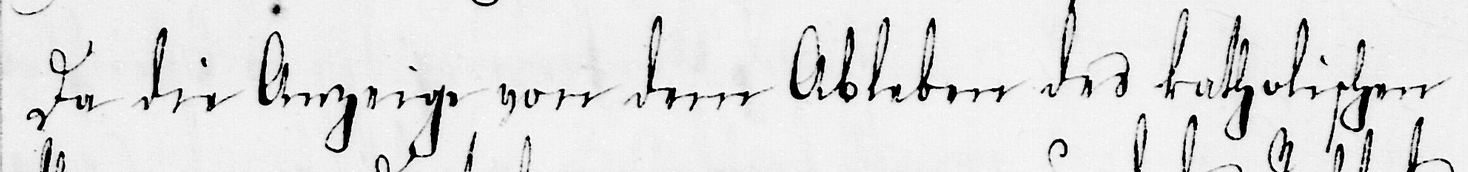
Da die Anzeige von dem Ableben des katholischen
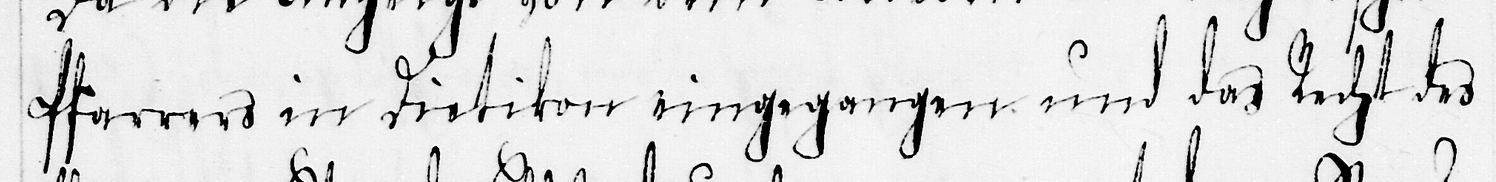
Pfarrers in Dietikon eingegangen und das Recht des
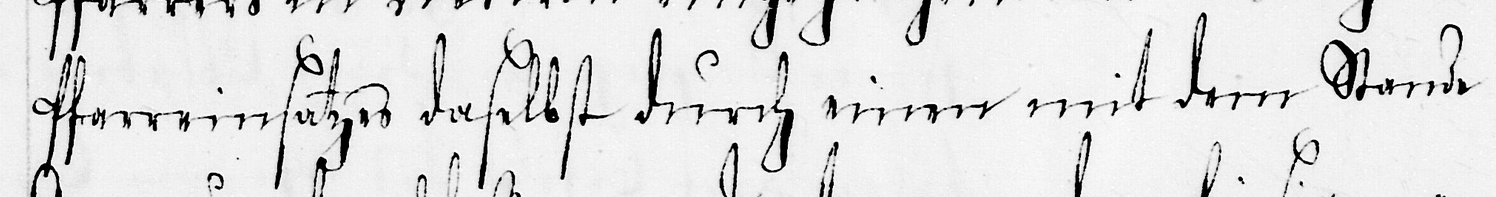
Pfarreinsatzes daselbst durch einen mit dem Stande
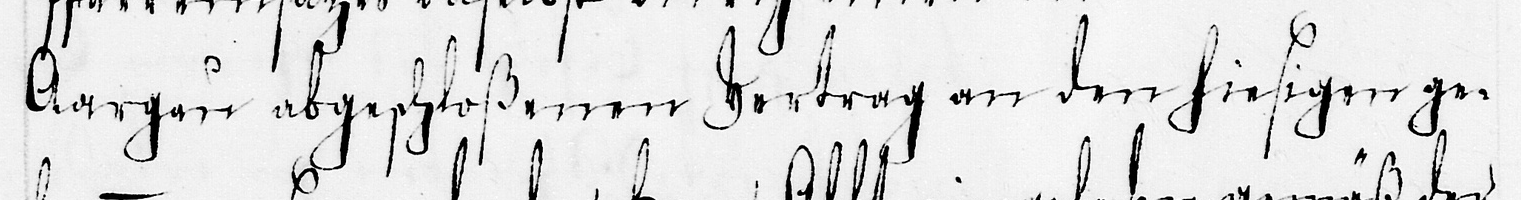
Aargau abgeschloßenen Vertrag an den hiesigen ge¬
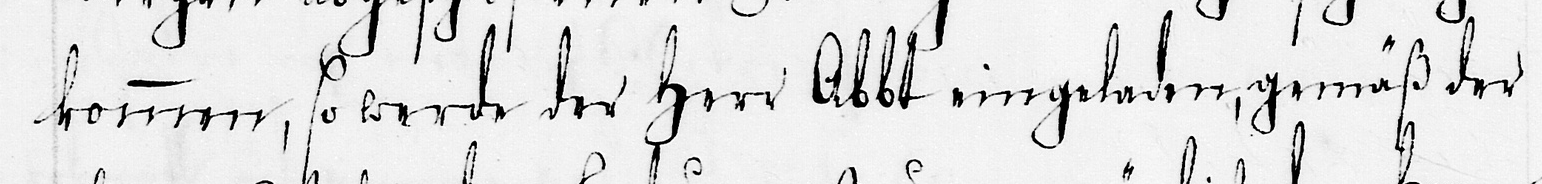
kommen, so werde der Herr Abbt eingeladen, gemäß der
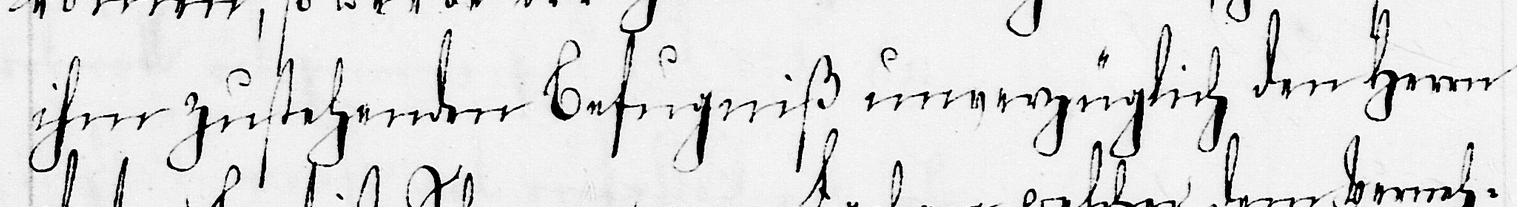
ihm zustehenden Befugniß unverzüglich den Herrn
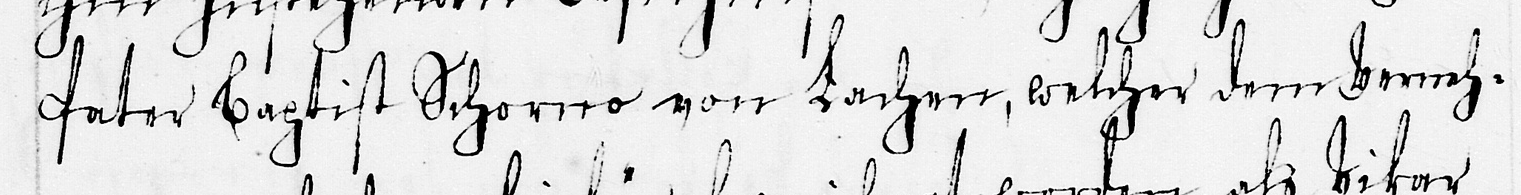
Pater Baptist Schorno von Lachen, welcher dem Verneh¬
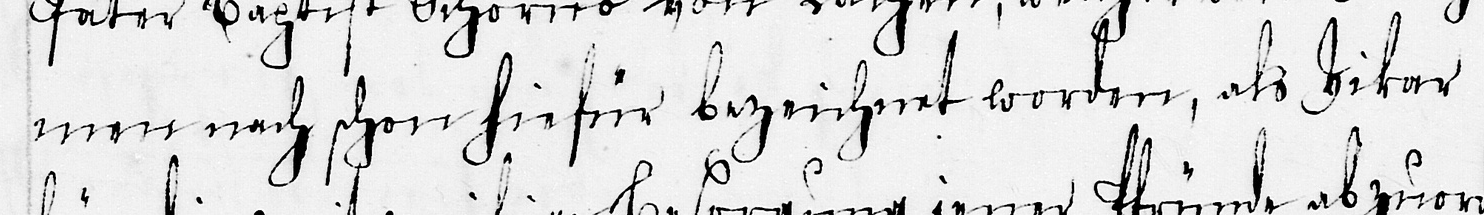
men nach schon hiefür bezeichnet worden, als Vikar
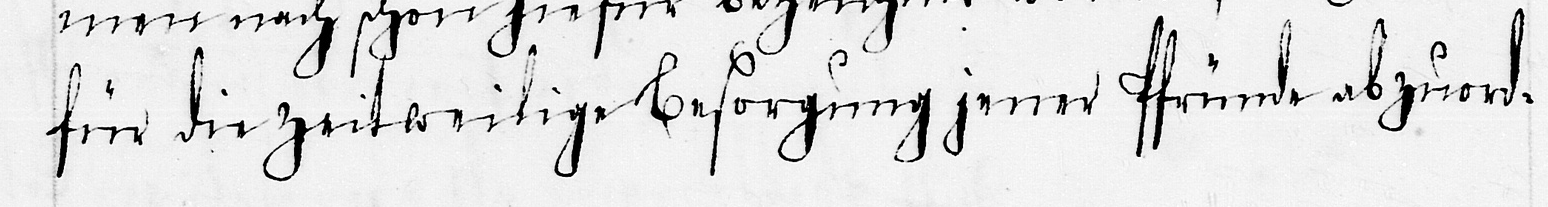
für die zeitweilige Besorgung jener Pfründe abzuord¬
